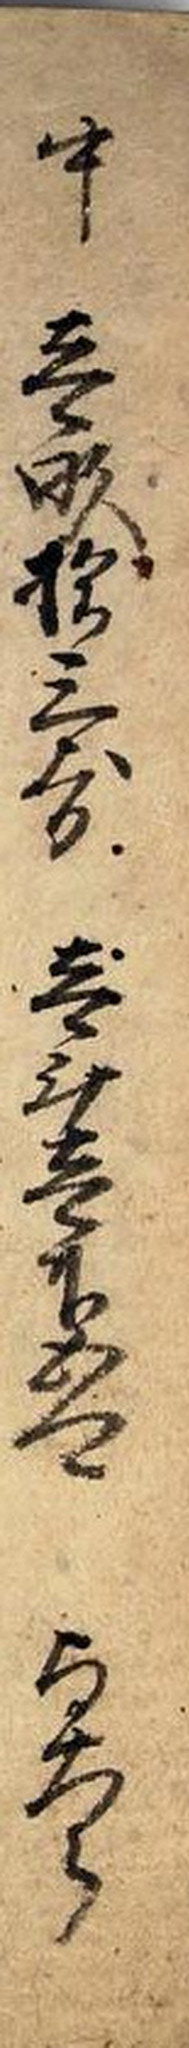中壱畝拾三歩壱斗壱升五合与大郎
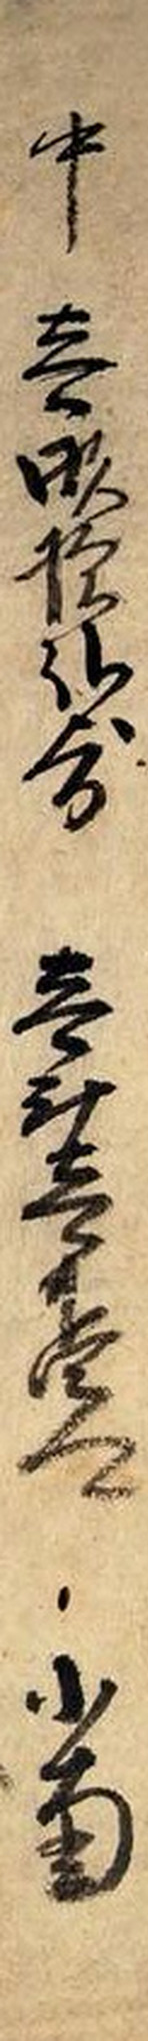中壱畝拾弐歩壱斗壱升四合小南
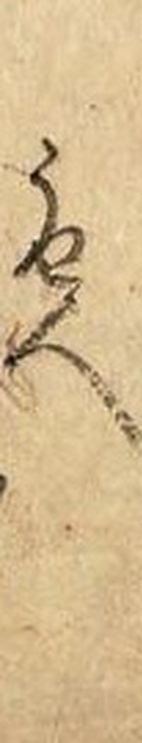うせ人
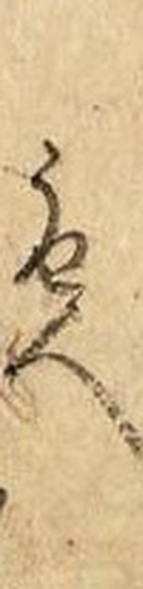うせ人
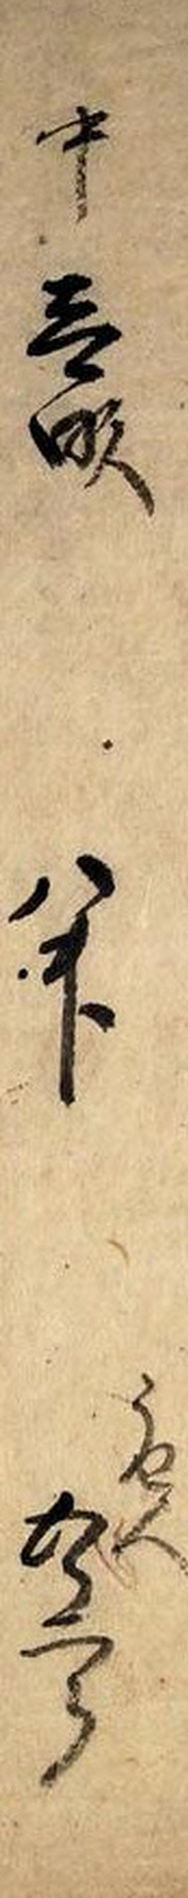中壱畝八升五郎二郎
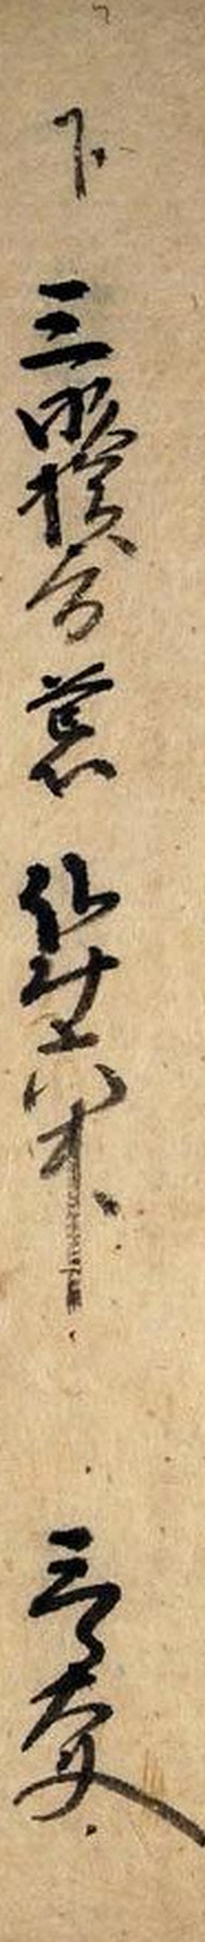下三畝拾歩荒弐斗六升三郎大夫
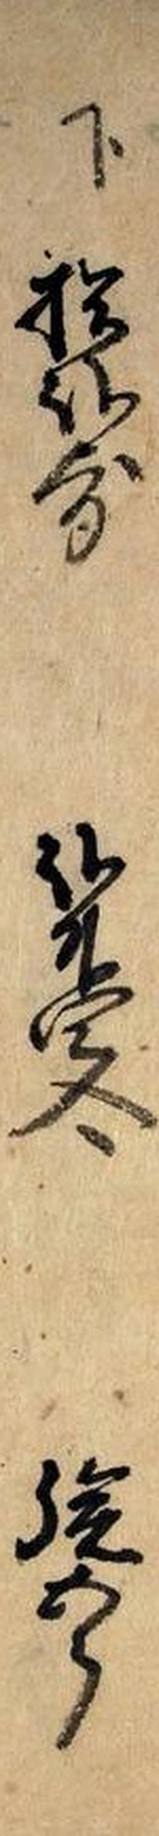下拾弐歩弐升四合孫五郎
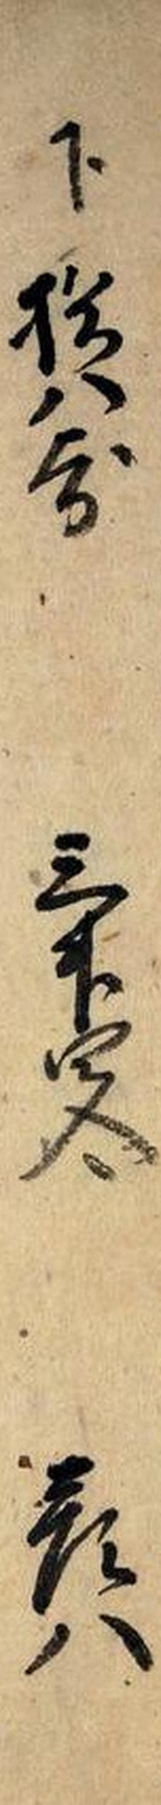下拾八歩三升四合彦八
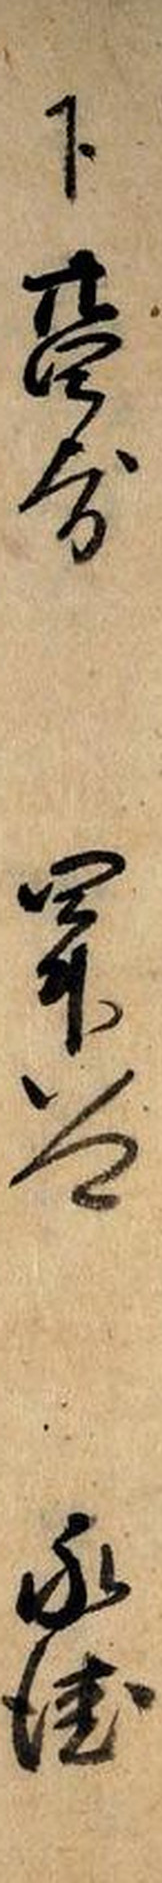下廿四歩四升八合永徳
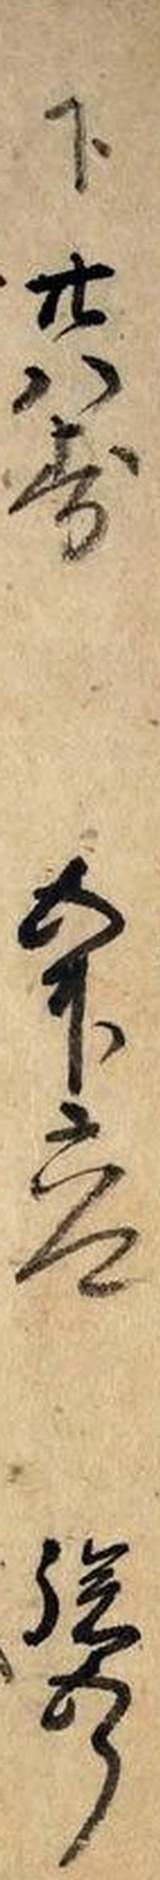下廿八歩五升六合孫五郎
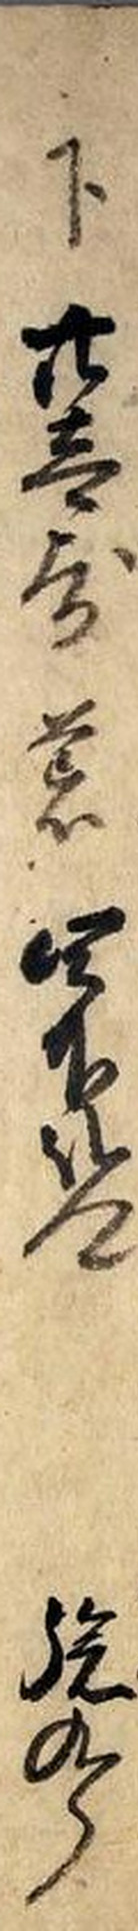下廿壱歩荒四升弐合孫九郎
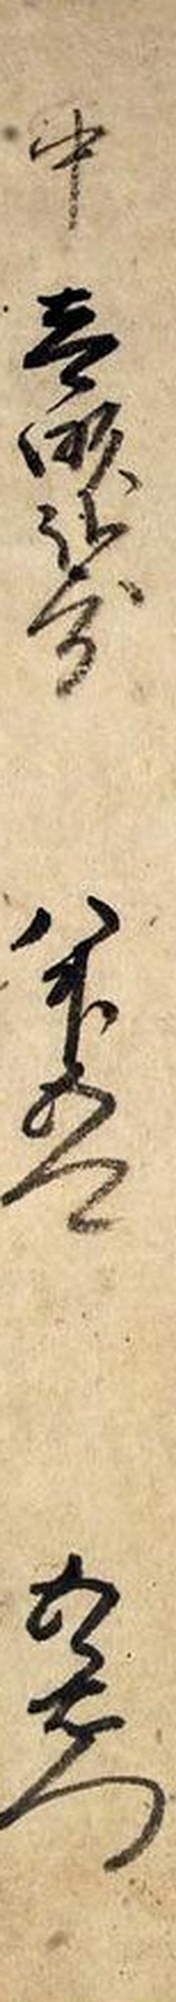中壱畝弐歩八升五合五郎右衛門
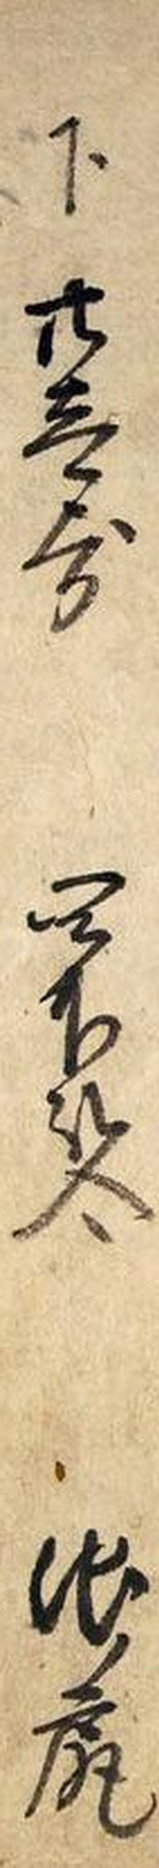下廿壱歩四升弐合池ノ尻

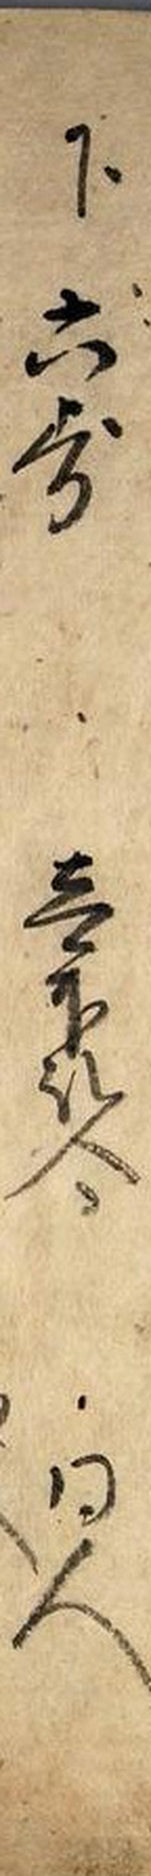下六歩壱升弐合同人
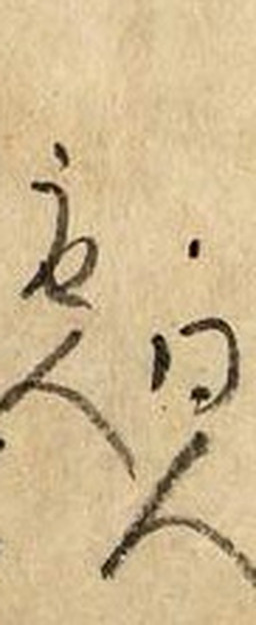うせ人
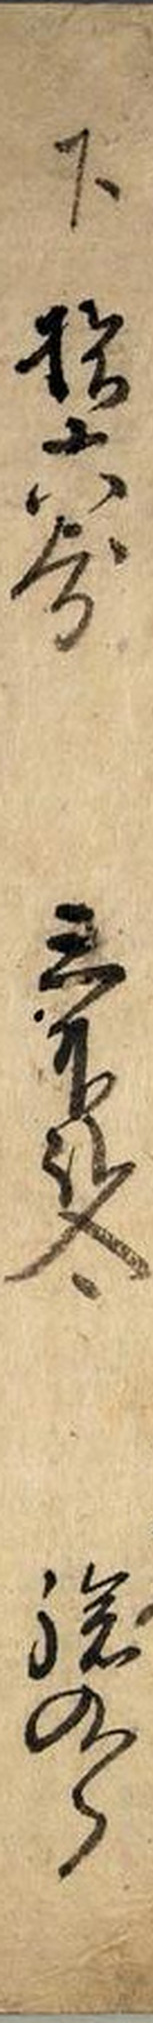下拾六歩三升弐合孫九郎
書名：若州三方郡之内世久見浦御検地帳（世久見浦検地帳写）
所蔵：福井県文書館 Fukui Prefectural Archives
